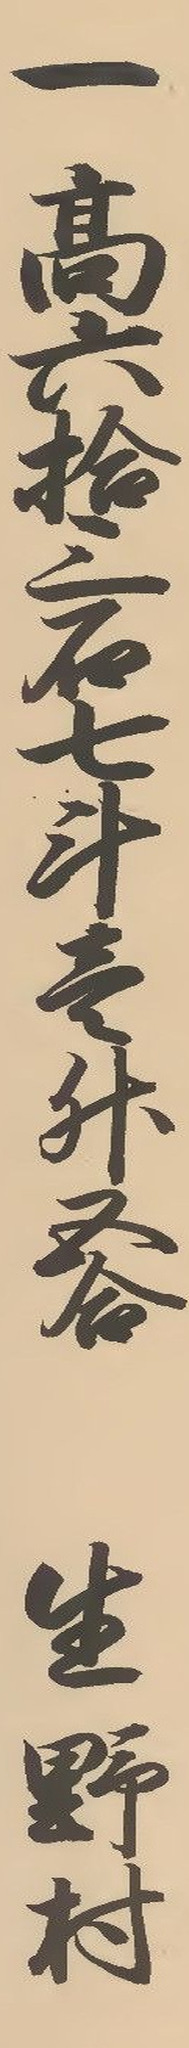一高六拾三石七斗壱升五合生野村
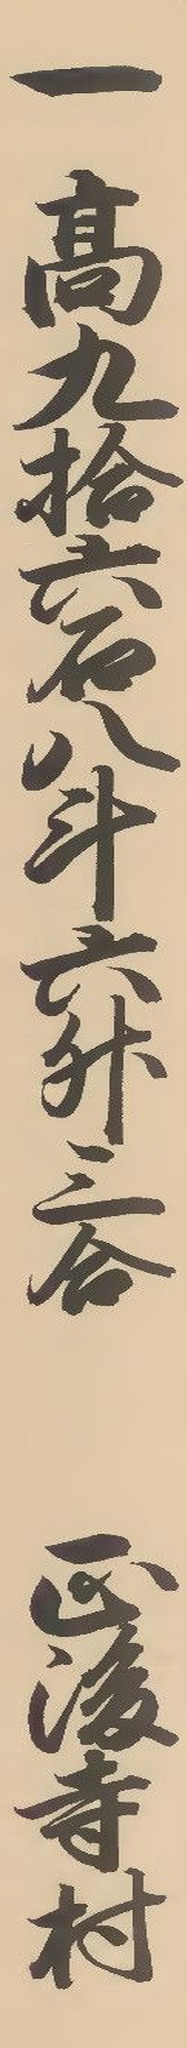一高九拾六石八斗六升三合正後寺村
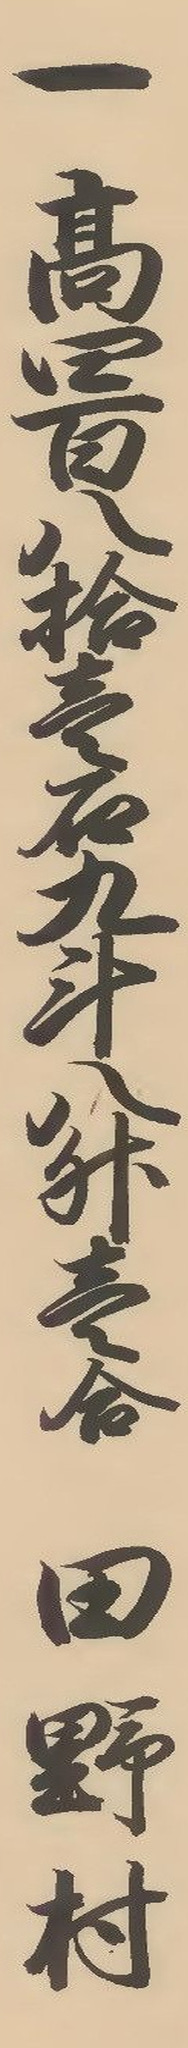一高四百八拾壱石九斗八升壱合田野村
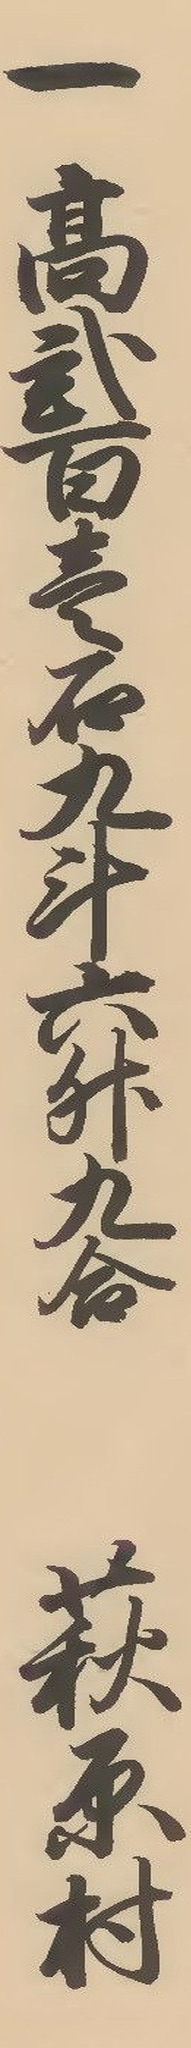一高弐百壱石九斗六升九合萩原村

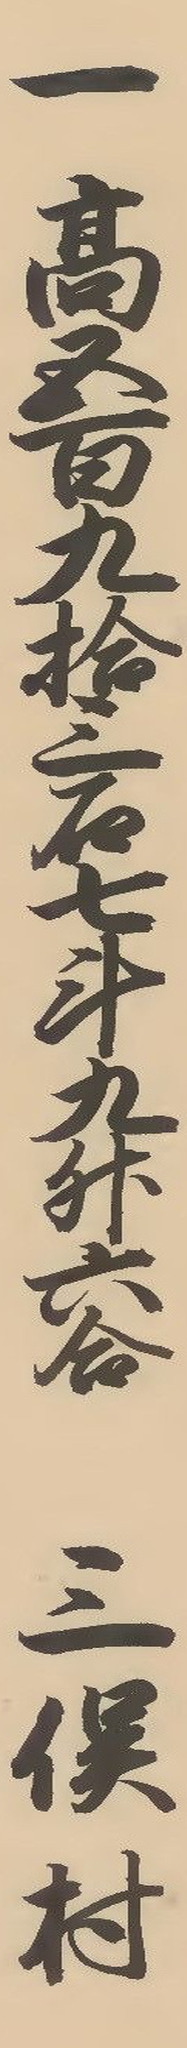一高五百九拾三石七斗九升六合三俣村
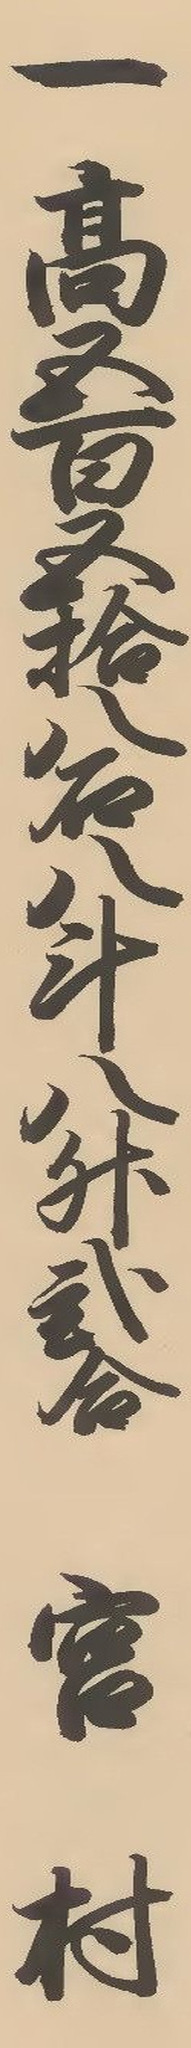一高五百五拾八石八斗八升弐合宮村
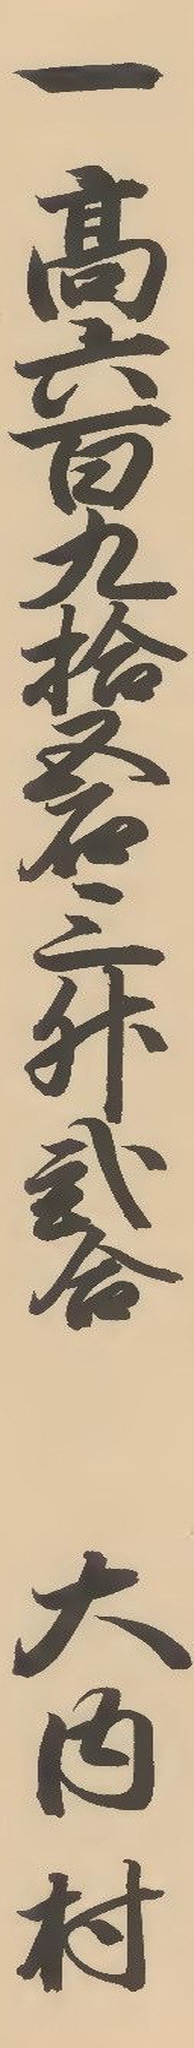一高六百九拾五石三升弐合大内村
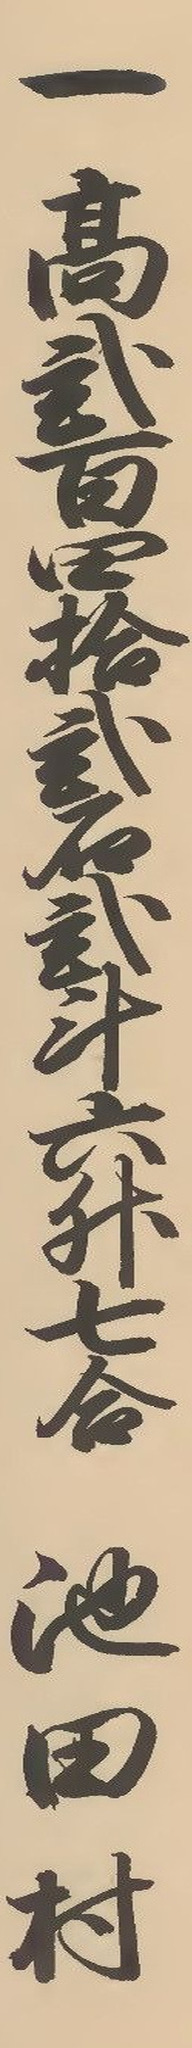一高弐百四拾弐石弐斗六升七合池田村
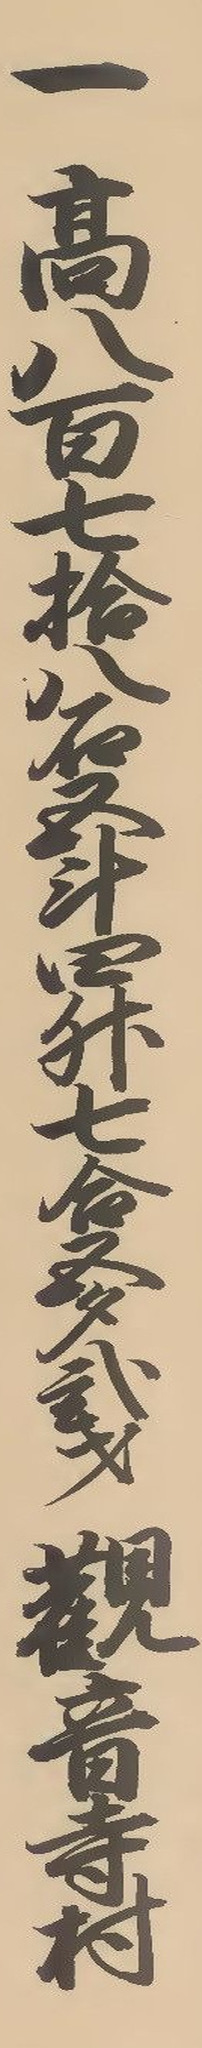一高八百七拾八石五斗四升七合五勺弐才観音寺村
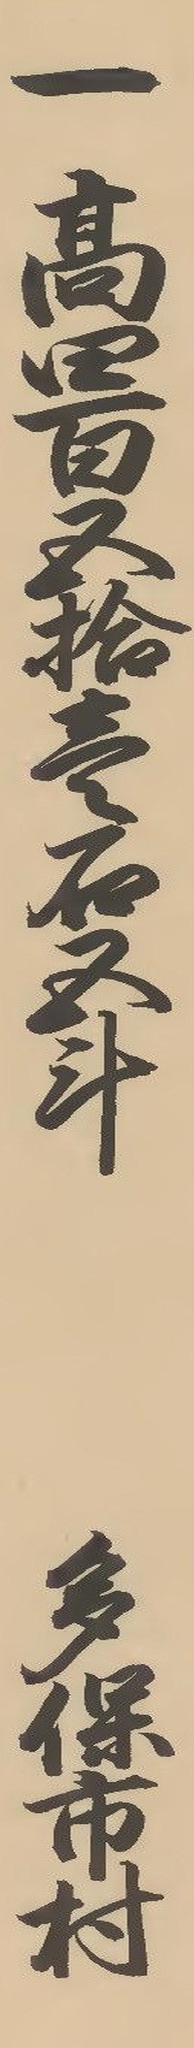一高四百五拾壱石五斗多保市村
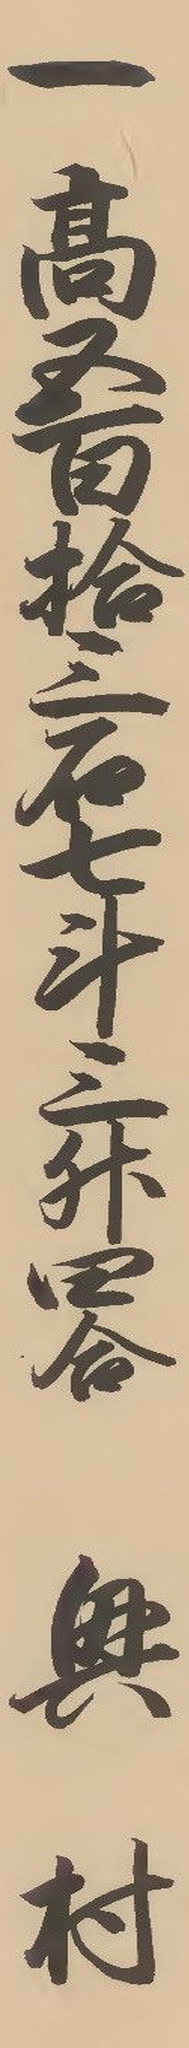一高五百拾三石七斗三升四合興村
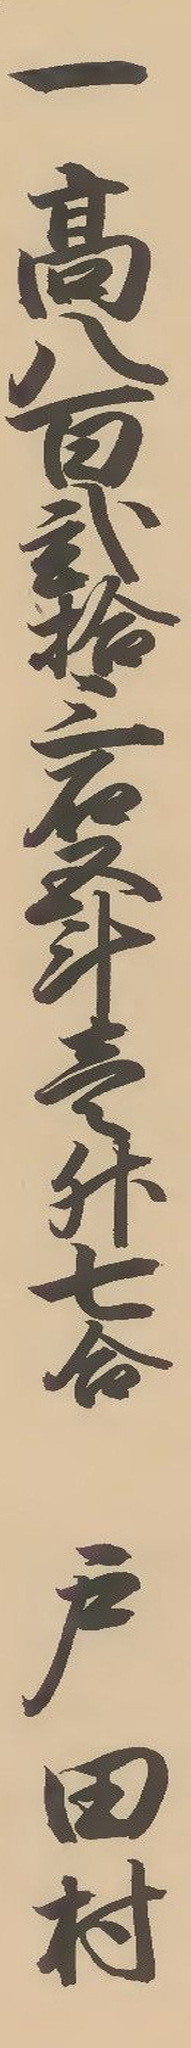一高八百弐拾三石五斗壱升七合戸田村

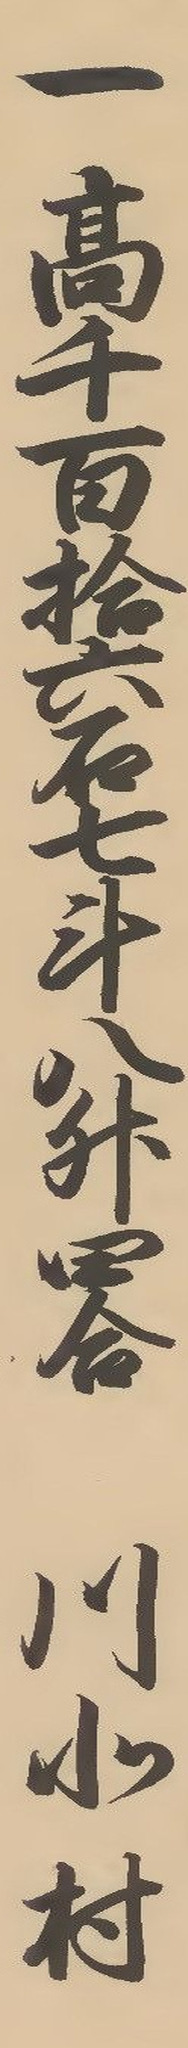一高千百拾六石七斗八升四合川北村
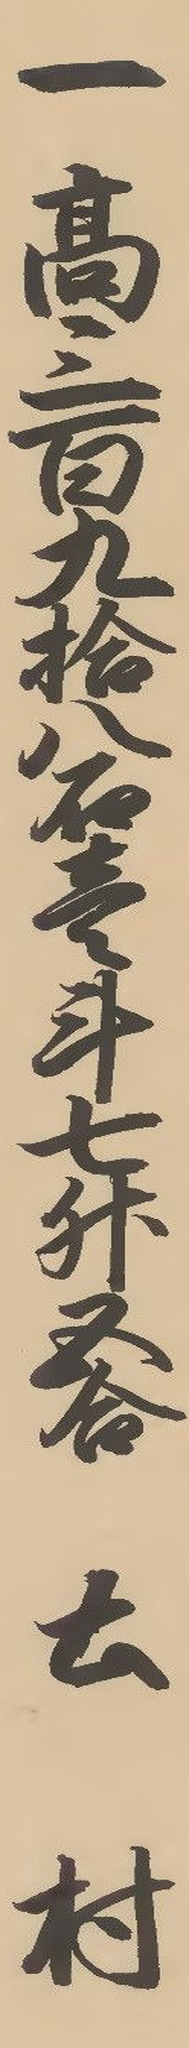一高三百九拾八石壱斗七升五合土村
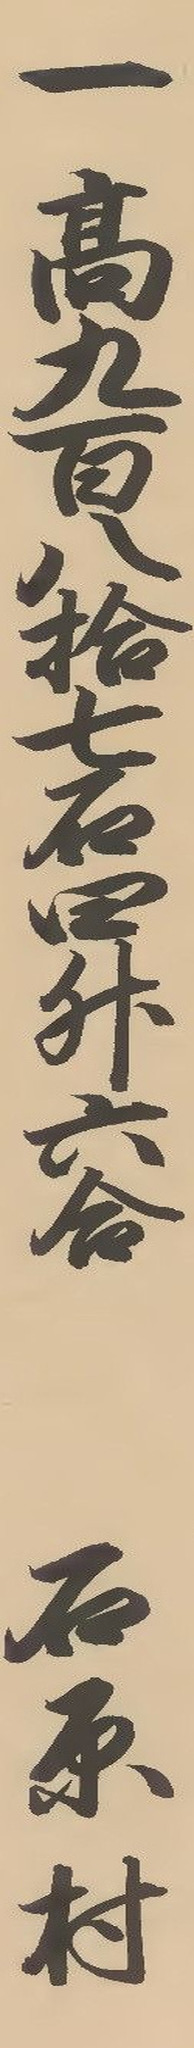一高九百八拾七石四升六合石原村
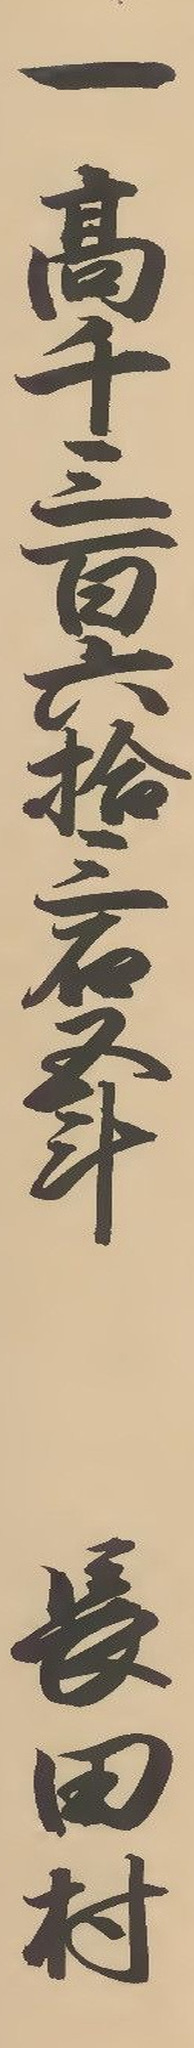一高千三百六拾三石五斗長田村
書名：丹波国郷帳
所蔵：国立公文書館 National Archives of Japan
